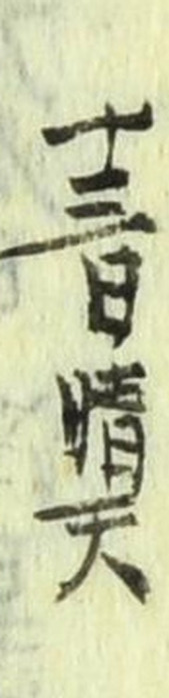十六日雨天
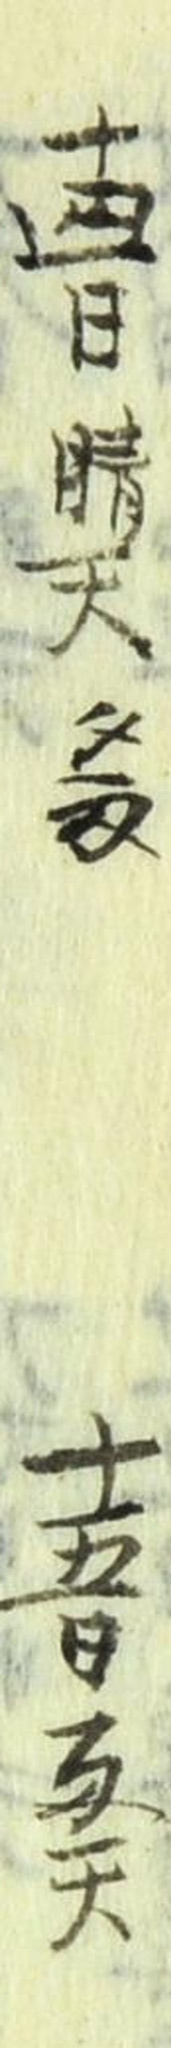十四日晴天夕雨十五日雨天
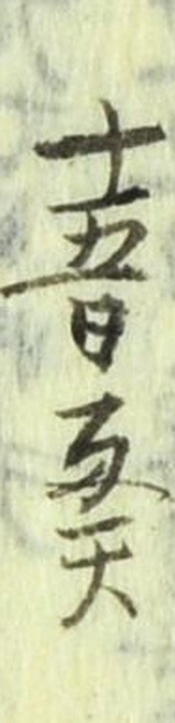十六日雨天
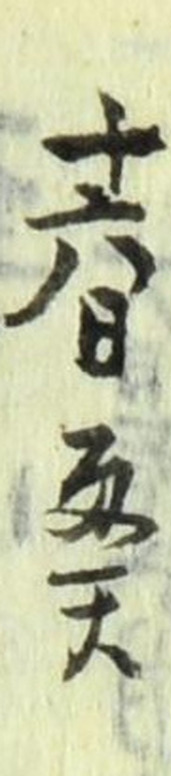十六日雨天
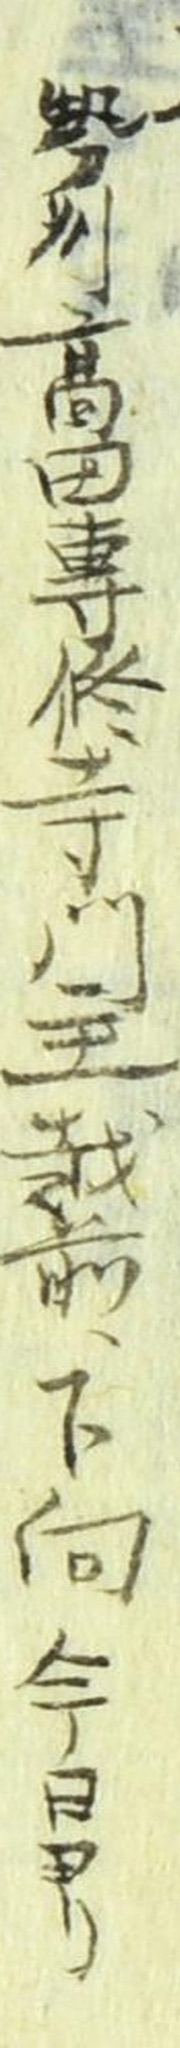勢州高田専修寺門主越前へ下向今日ヨリ
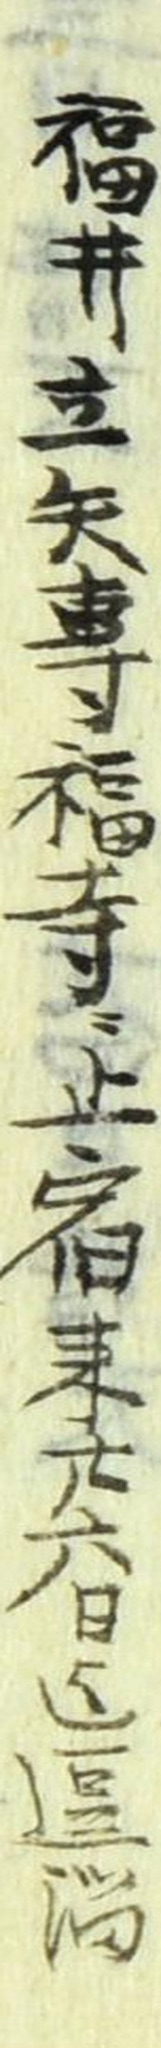福井立矢専福寺ニ止宿来廿六日迄逗留
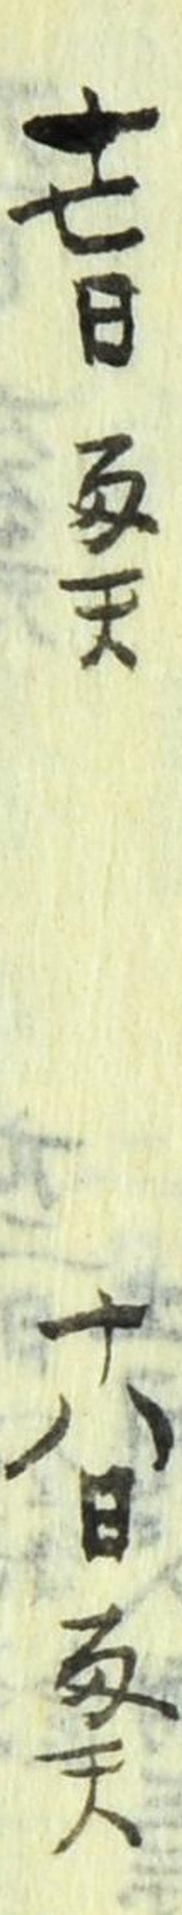十七日雨天十八日雨天
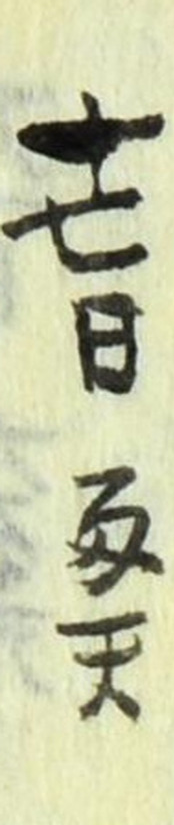十六日雨天
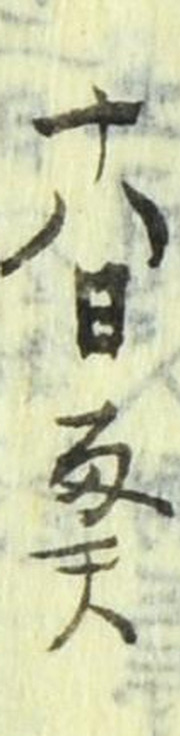十六日雨天
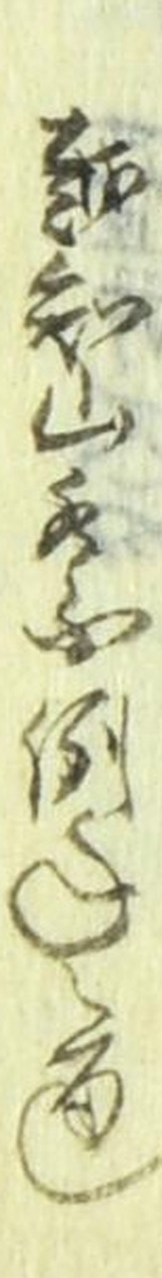越知山祭例年之通
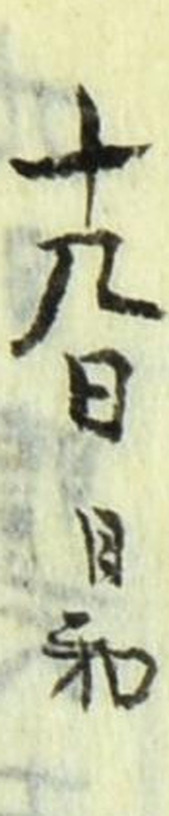十九日日和

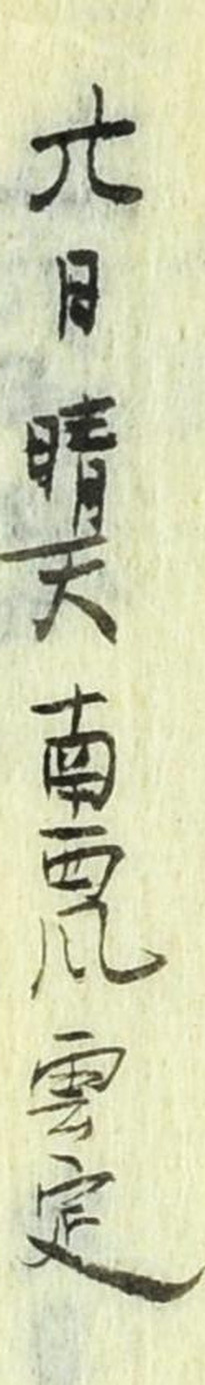廿日晴天南西風雲定
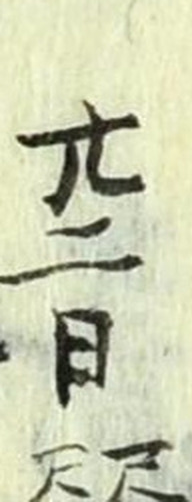廿七日
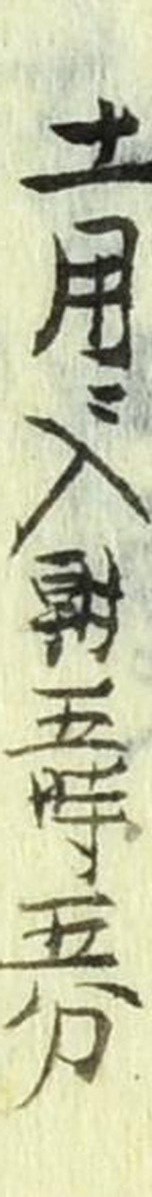土用ニ入朝五時五分
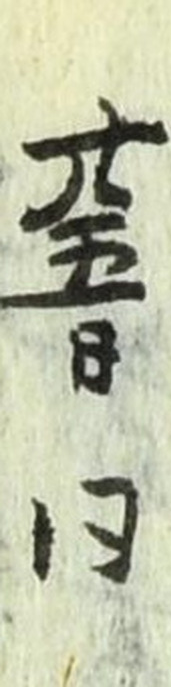廿五日同
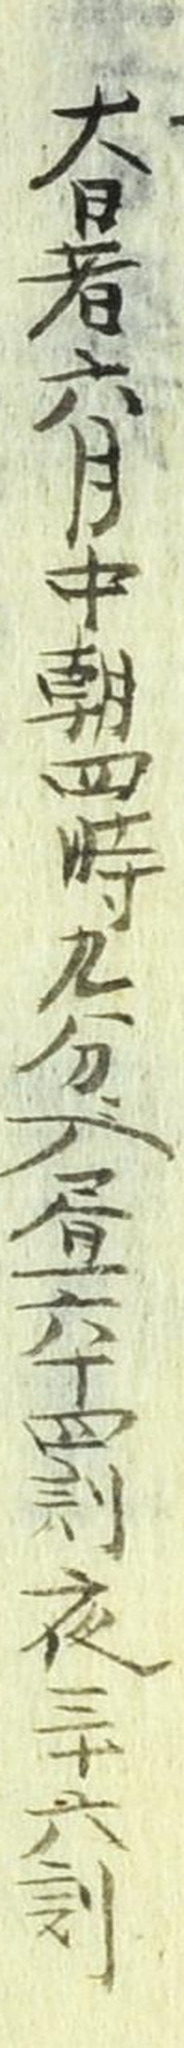大暑六月中朝四時九分入昼六十四刻夜三十六刻
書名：（日記）
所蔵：福井県文書館 Fukui Prefectural Archives
